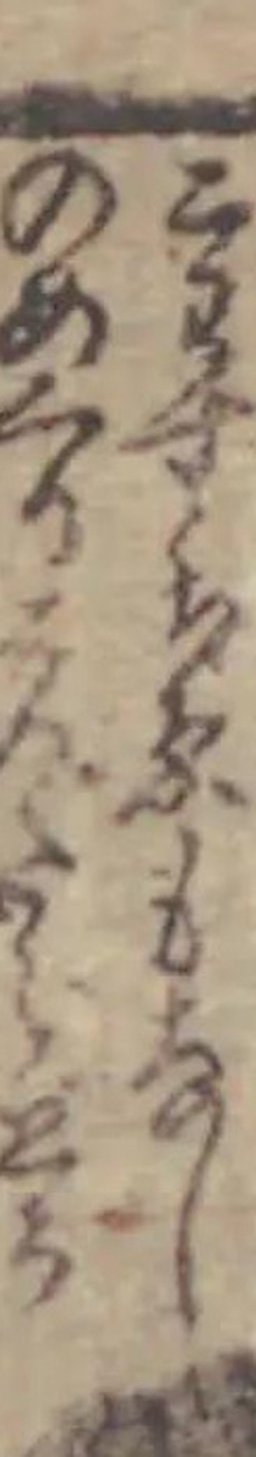のめくりこんたらとう
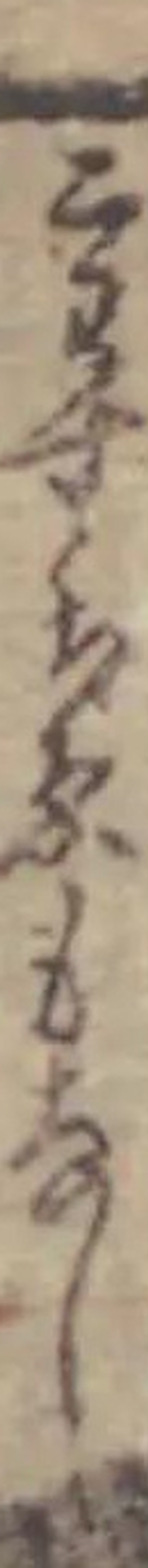こわすちゑもなし
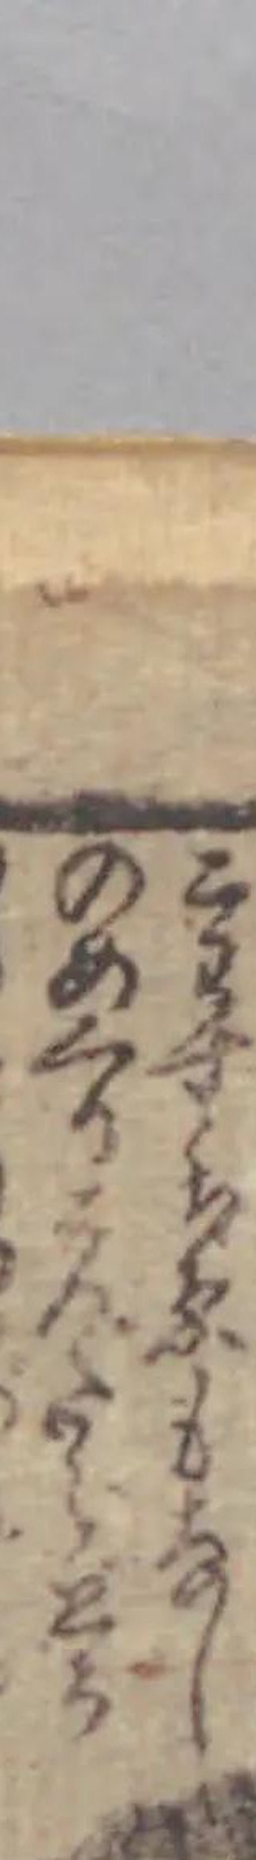のめくりこんたらとう
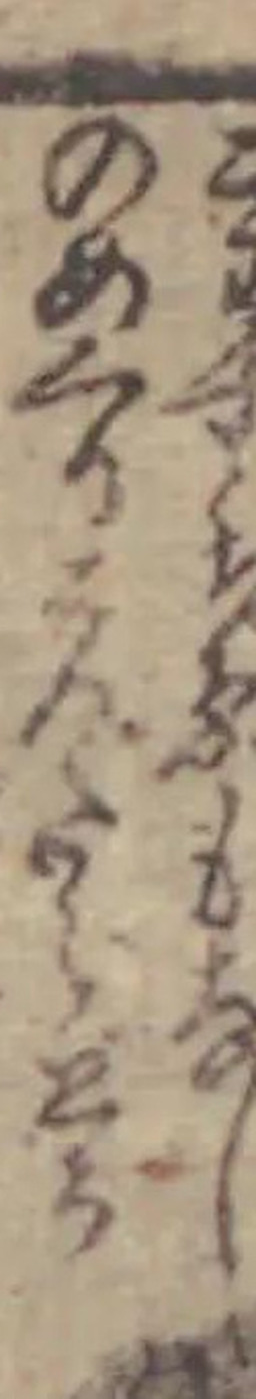のめくりこんたらとう
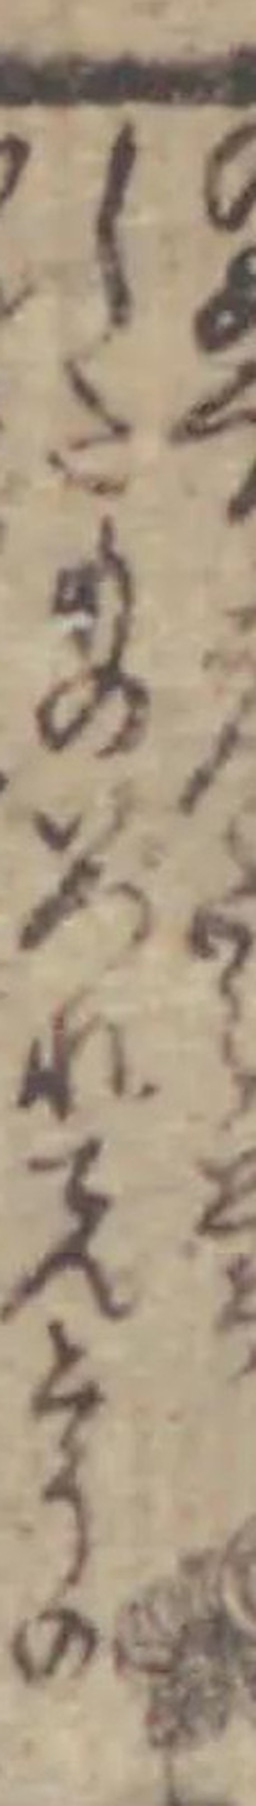したものいづれてんとうの
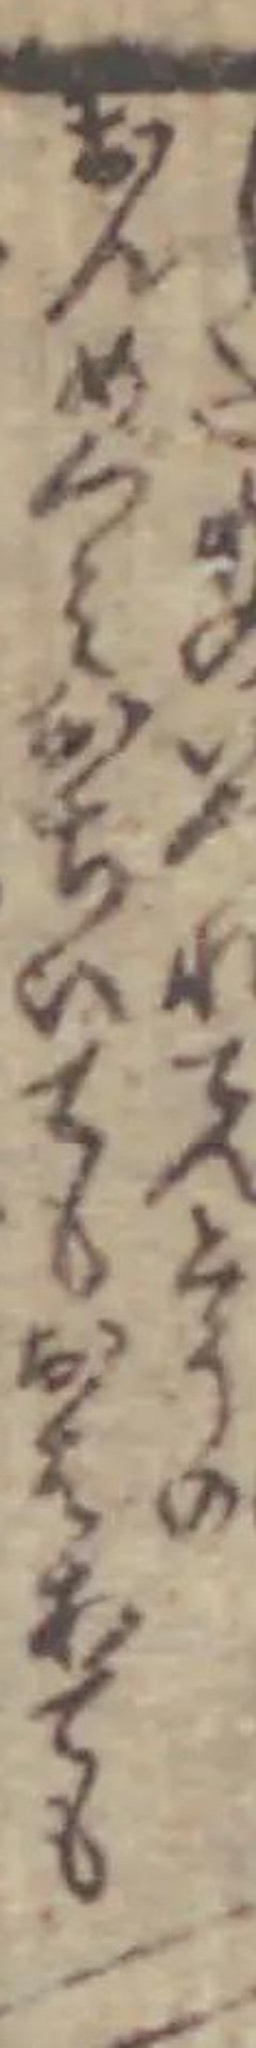おんめくみおちいてもおはあても
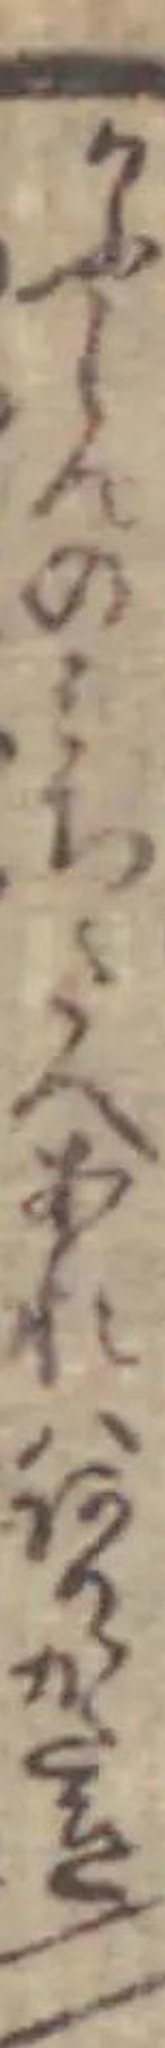かふしんのみちさへあれはありかたき
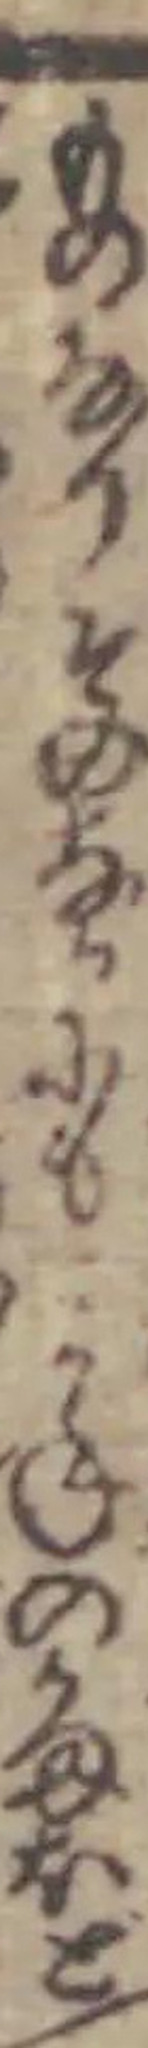ものなりそのなかにもこかねのかまほど
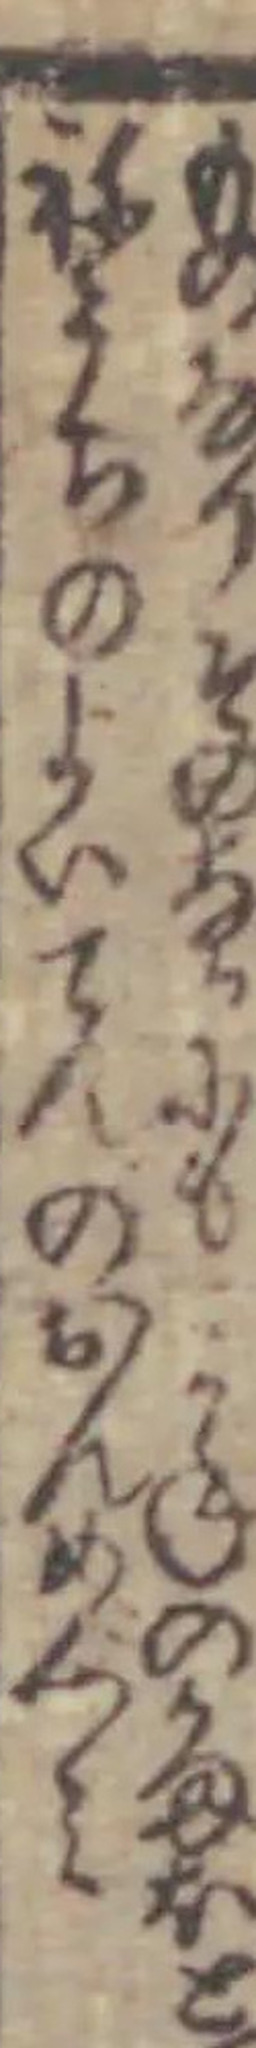ねうちのよいてんのおんめぐみ

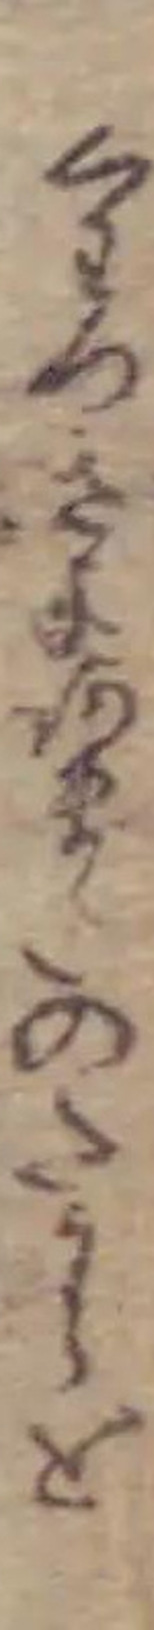くわつきよあまたのさかしらを
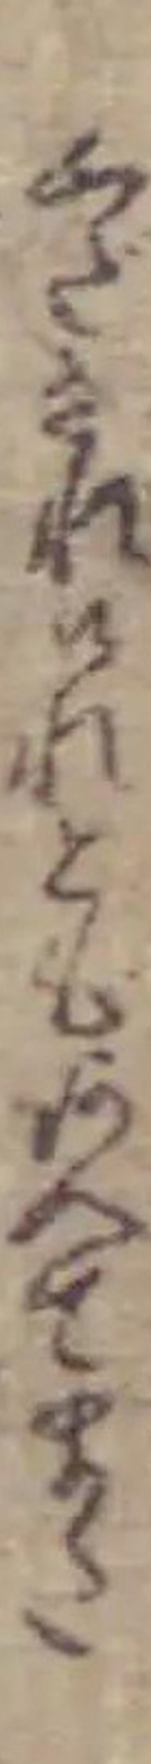くだされけれともあへてまた
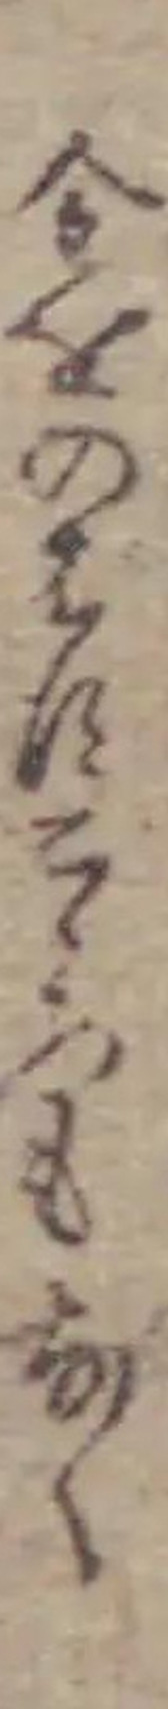金をのはすこゝろもなく
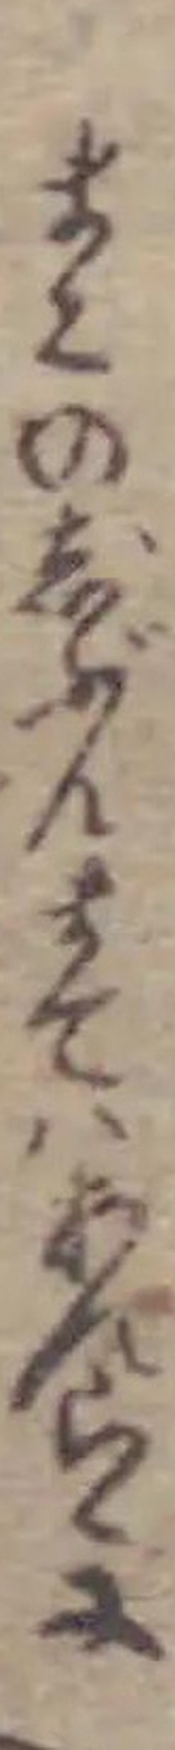まこのじぶんまてはあんらくに
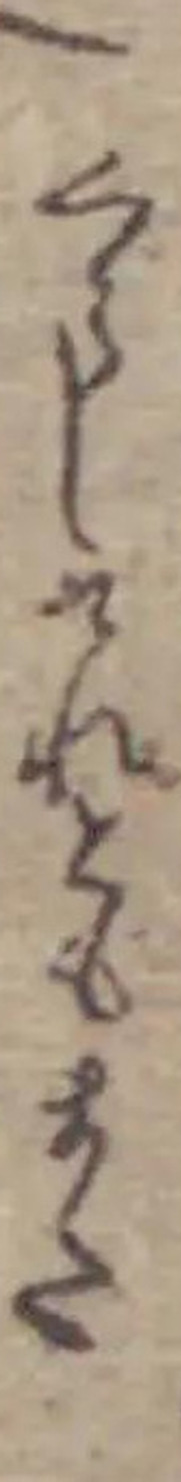くらしけれともまこ
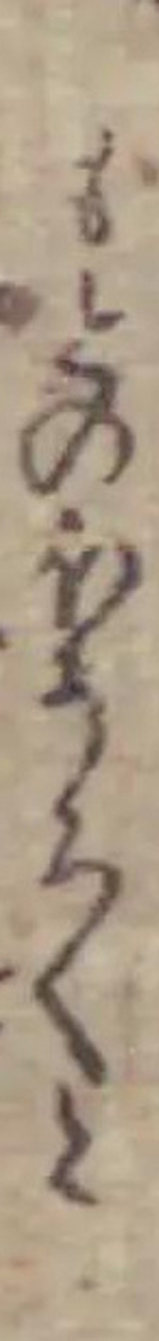もとのほうらくと
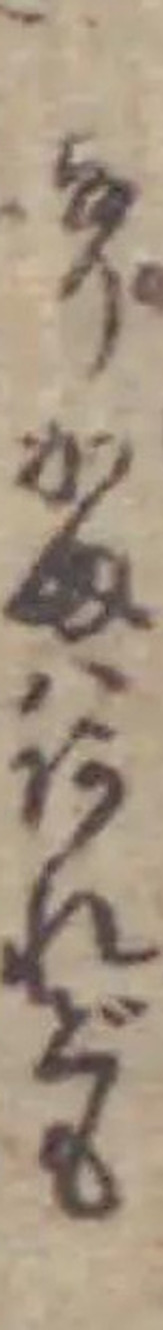なりかまはあれども
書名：間違月夜鍋 2巻
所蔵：国立国会図書館 National Diet Library, JAPAN
